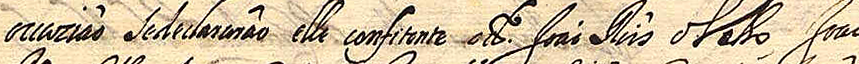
occazião se declararão elle confitente o d̄o. Joaõ Roīs o Velho, Joaõ
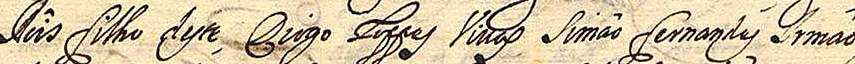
Roīs filho deste, Diogo Loppes Viuas Simaõ fernandes Irmaõ
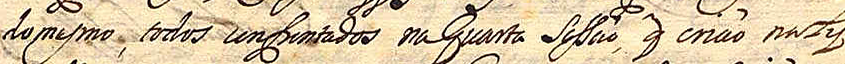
do mesmo, todos confrontados na Quarta Sessaõ, q̄ criaõ na Lej
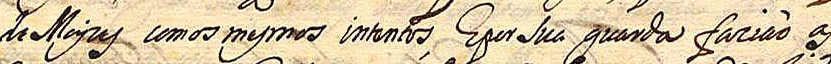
de Moyzes com os mesmos intentos, E por sua guarda faziaõ as
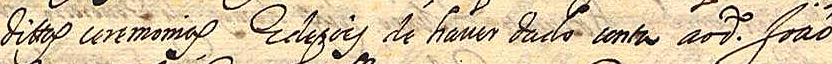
dittas ceremonias, E depois de hauer dado conta ao d̄o. Joaõ
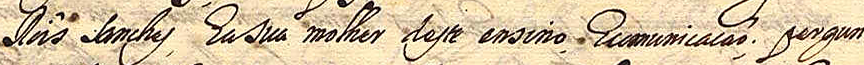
Roīs Sanches, E a sua molher deste ensino, E comunicacaõ; pergun
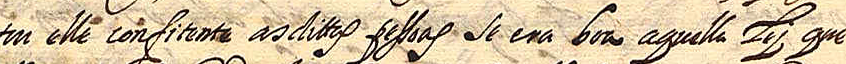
tou elle confitente as dittas pessoas se era boa aquella Lej que
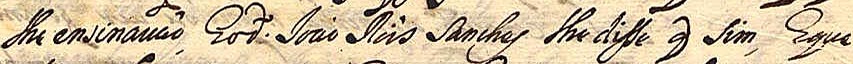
lhe ensinauaõ, E o d̄o. Ioaõ Roīs Sanches lhe disse q̄ sim, E que
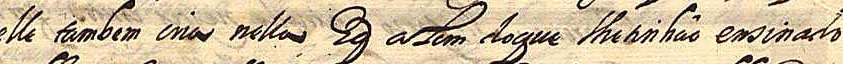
elle tambem cria nella E q̄ aLem do que lhe tinhaõ ensinado
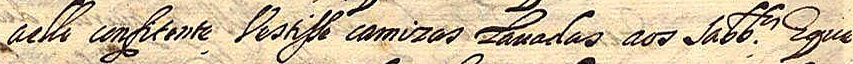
a elle confitente, Vestisse camizas Lauadas aos Sab̄b.os E que
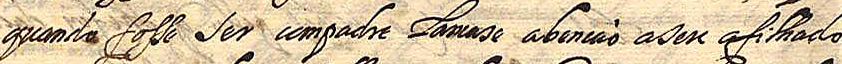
quando fosse ser compadre Lancase a bencaõ a seu afilhado
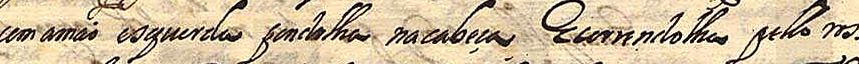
com a maõ esquerda pondolha na cabeça, E correndolha pello ros
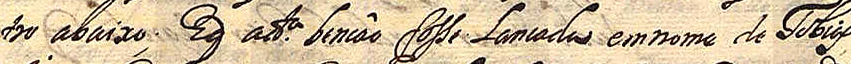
tro abaixo; E q̄ a d̄a. bencaõ fosse Lancada em nome de Tobias
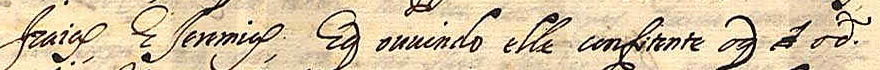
Jzaias, E Jeremias, e q̄ ouuindo elle confitente o q̄ el o d̄.o
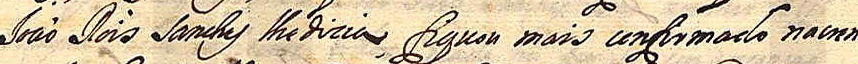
Ioaõ Roīs Sanches lhe dizia, fiquou mais confirmado na cren
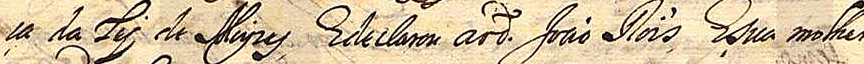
ça da Lej de Moyzes, E declarou ao d̄o. Joaõ Roīs E sua molher
